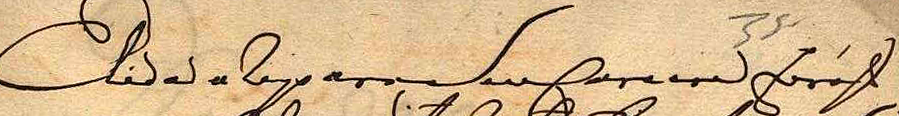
E hida a Re para Seu Carcere foraõ
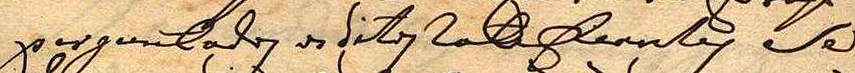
perguntados os ditos Rateficantes se
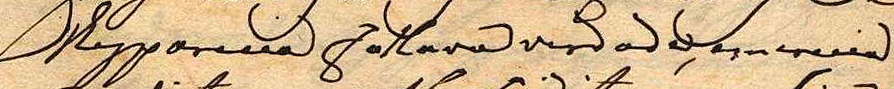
lhes parecia fallava verdade, e merecia
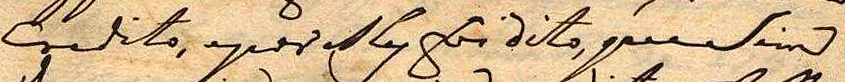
Credito, e por elles foi dito, que Sim
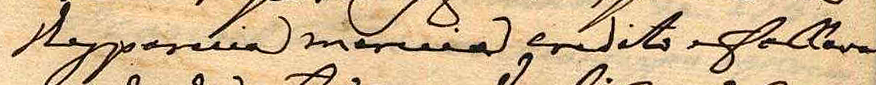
lhes parecia merecia credito e fallava
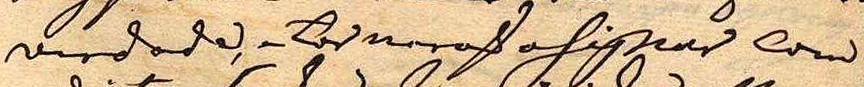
verdade, e tornaraõ a signar com
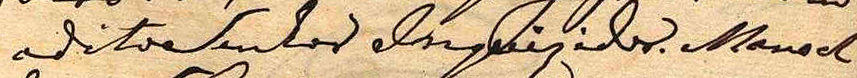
o dito Senhor Inquizidor Manoel
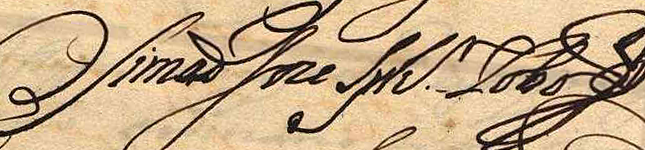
Simaõ Joze sylv.r Lobo
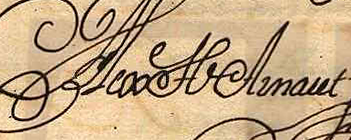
ALexe He Arnaut
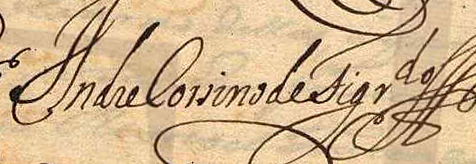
Andre Corsino de figrdo
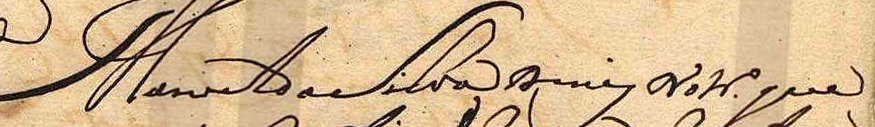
Manoel da Silva Denis Notr.o que
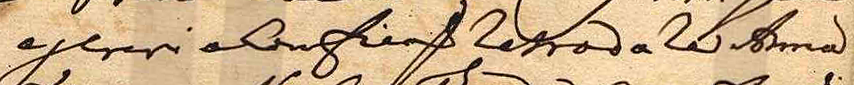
escrevi a Confiçaõ Retro da Re Anna
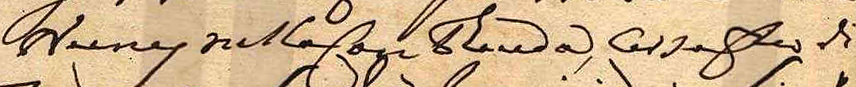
Nunes nella Contheuda, Certefico di
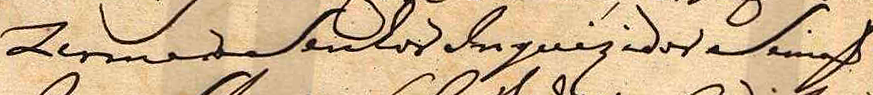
Zerem o Senhor Inquizidor Simaõ
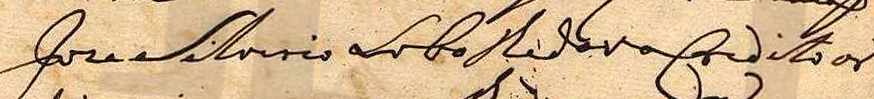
Joze Silverio Lobo lhe dava Credito or
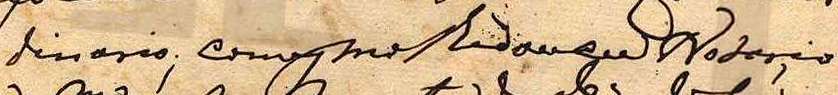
dinario, e o mesmo lhe dou eu Notario
